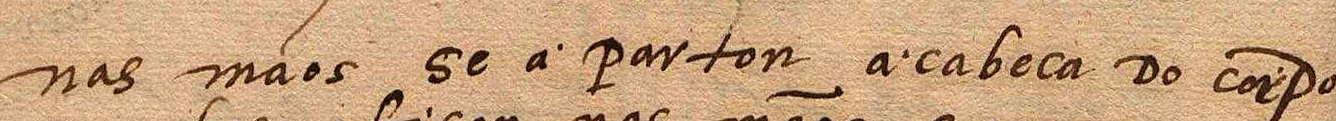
nas mãos se apartou a cabeça do corpo
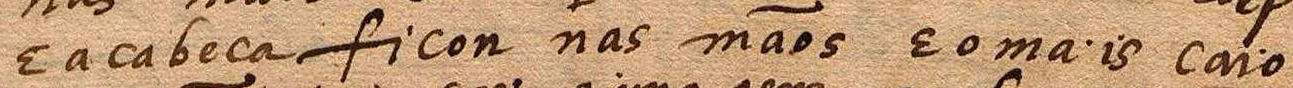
E a cabeça ficou nas mãos e o mais caio
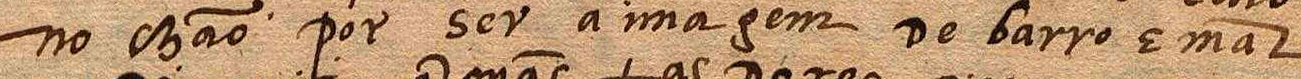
no chão por ser a imagem de barro e maL
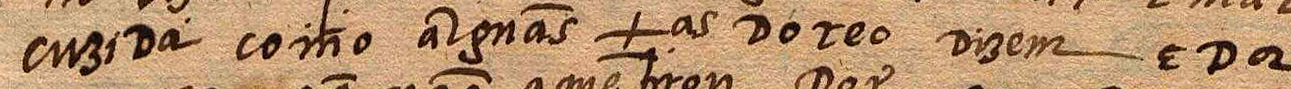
cuzida como alguās tas do reo dizem e da
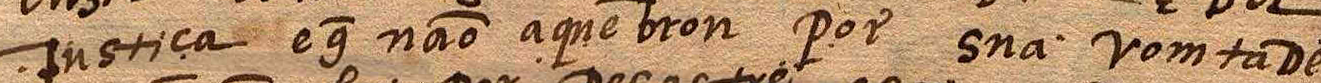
Justiça e q̄ não a quēbrou por sua vomtade
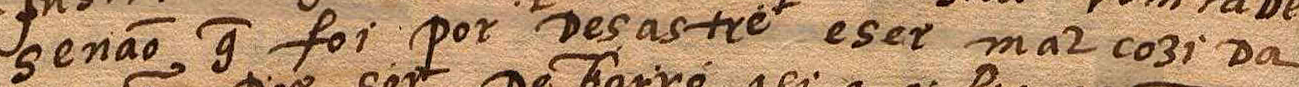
senão q̄ foi por desastre e ser mal cozida
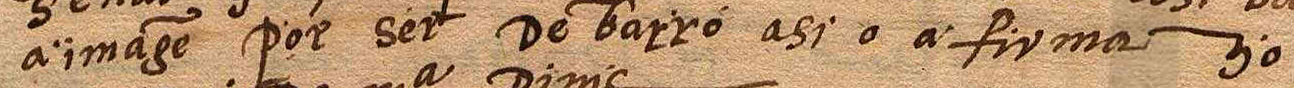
a imagē por ser de barro asi o afirma ho
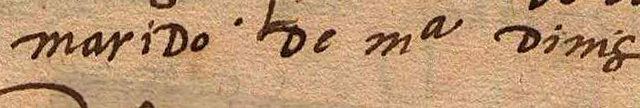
marido de ma dinis
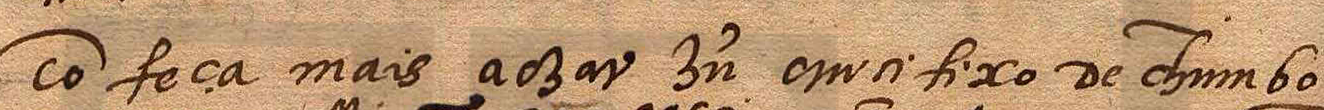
C̄ofeça mais achar hū crucifixo de chumbo
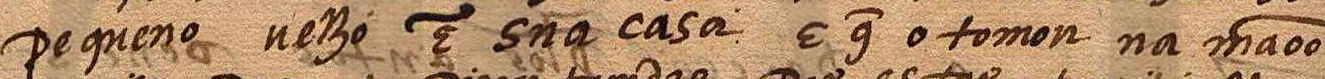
pequeno uelho Ē sua casa E q̄ o tomou na mãoo
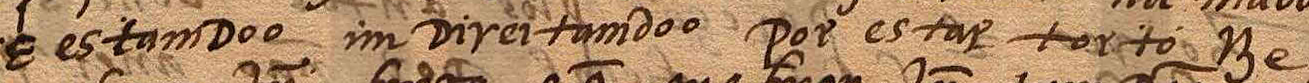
E estamdoo imdireitamdoo por estar torto lhe
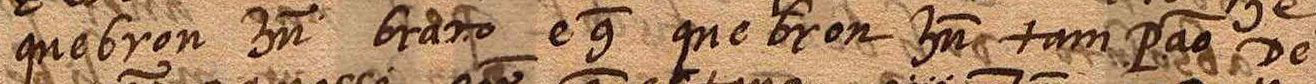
quebrou hū braço e q̄ quebrou hū tampão de
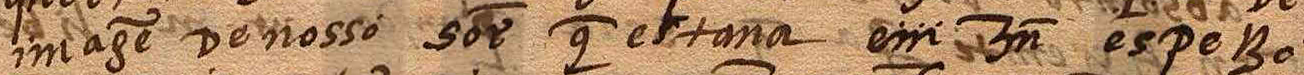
imagē de nosso sōr q̅ estaua em hū espelho
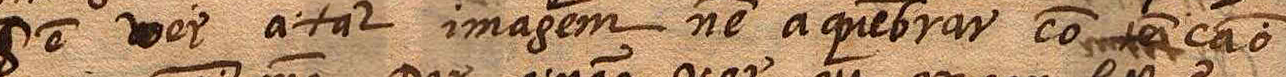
Sē ver a tal imagem nē a quēbrar c̄o tēção
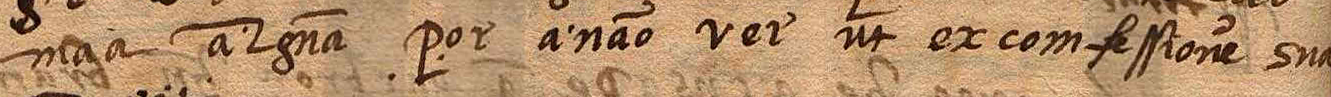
maa algūa por a não ver ut ex comfessionē sua
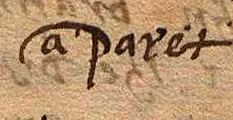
aparet
